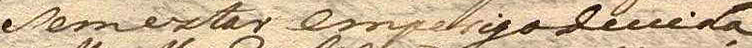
sem eztar em perigo de uida,
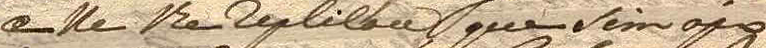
elle lhe Replicou, que sim o po
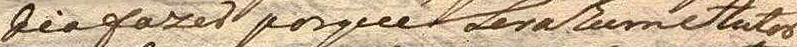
dia fazer porque Lera hum Autor
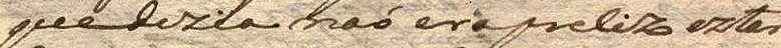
que dezia naõ era precizo eztar
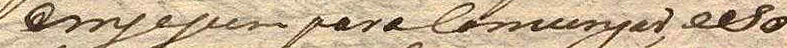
em jejum para Comungar, e So
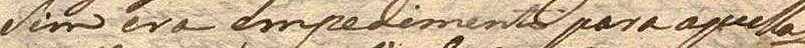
sim era empedimento para aquellaz
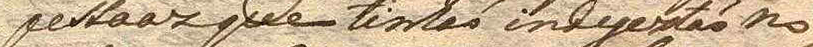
pessoaz que tinhaõ indegestaõ no
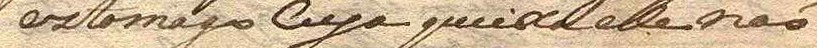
eztomago Cuja queixa elle naõ
